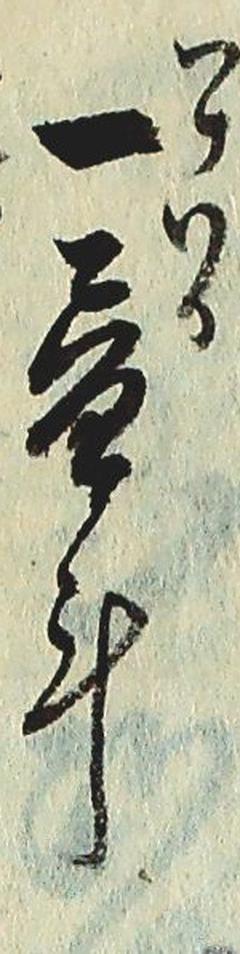一昼夜
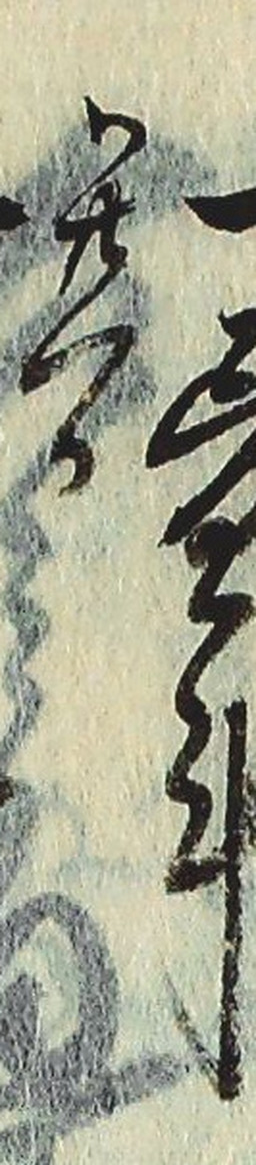同廿八日
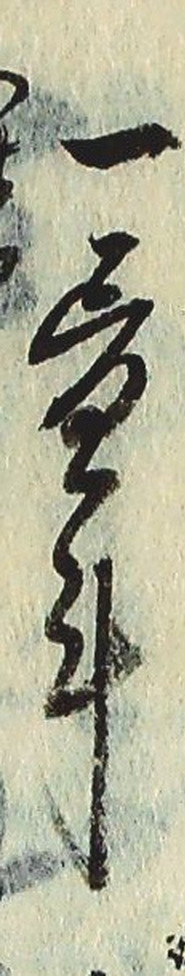一昼夜
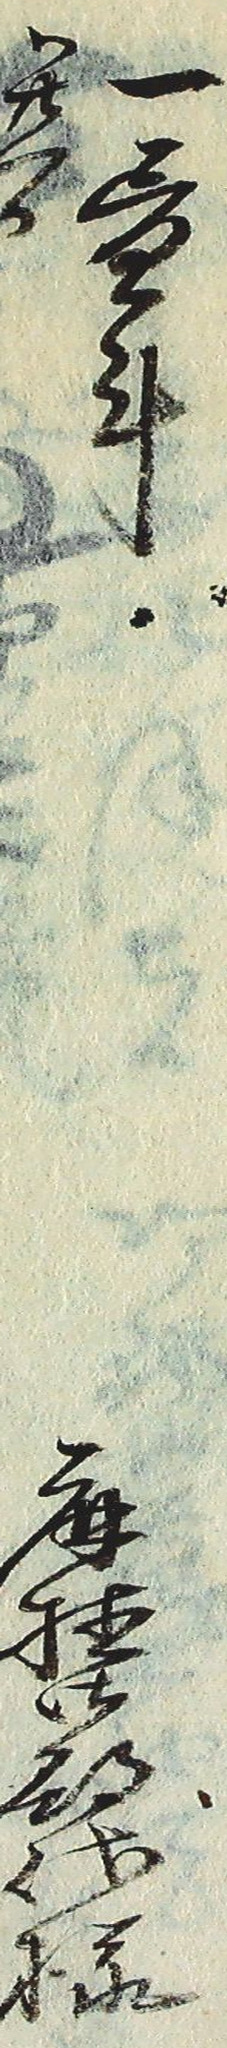一昼夜麻植御郡代様
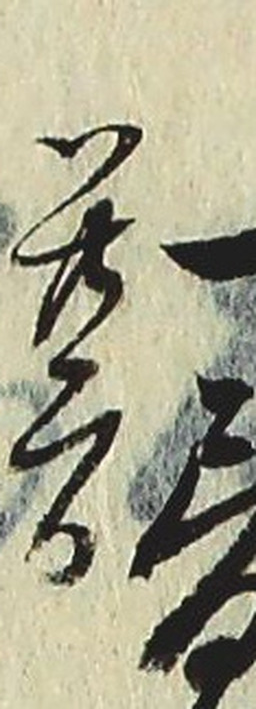同廿二日
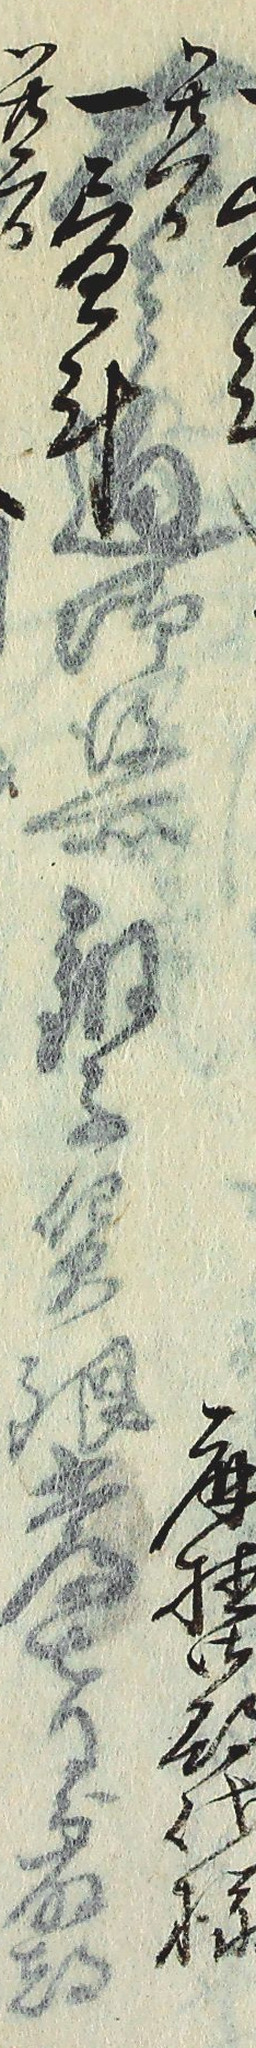一昼夜
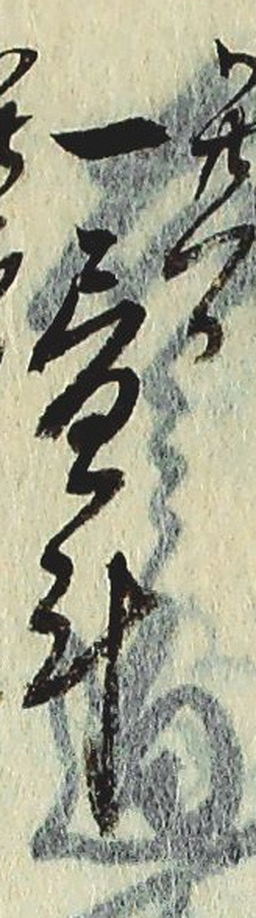一昼夜
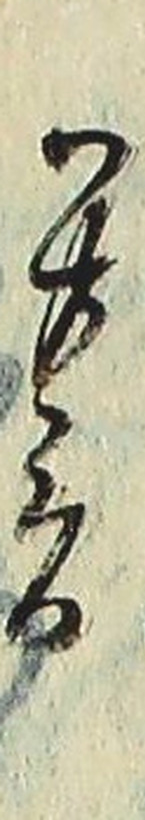同廿三日
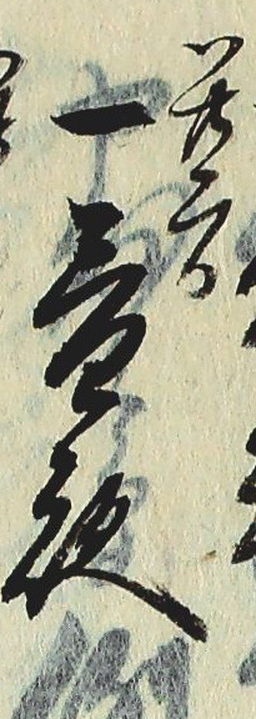一昼夜
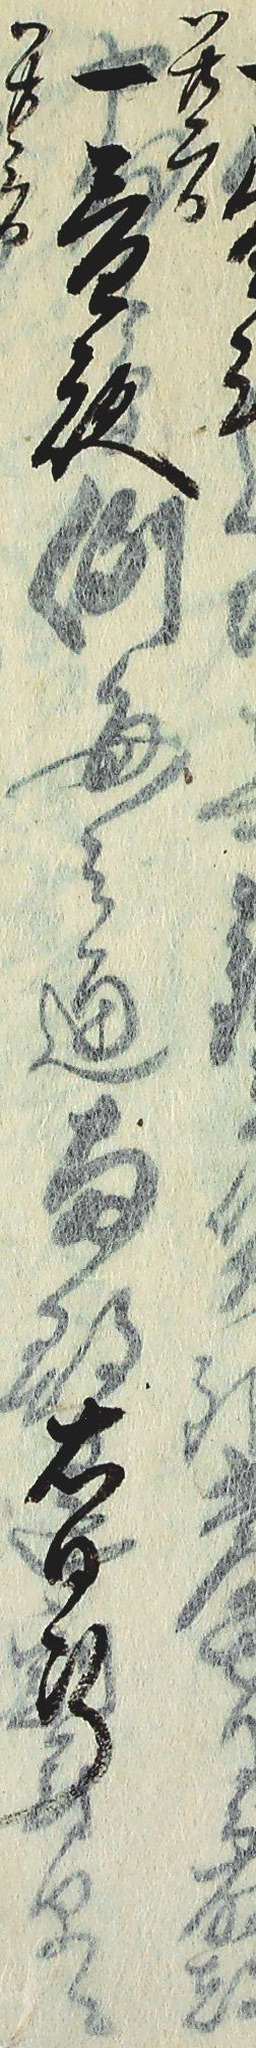一昼夜右同断
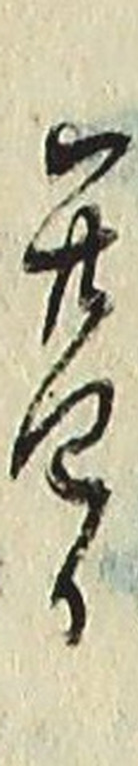同廿四日
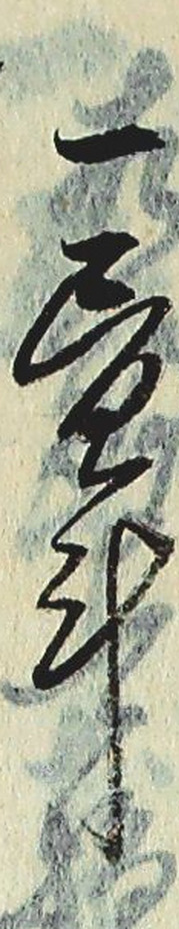一昼夜
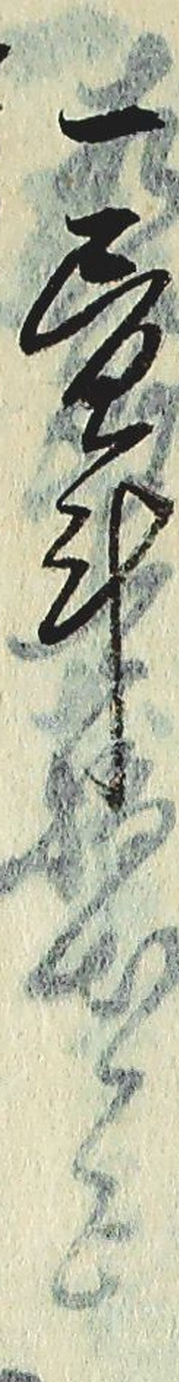一昼夜
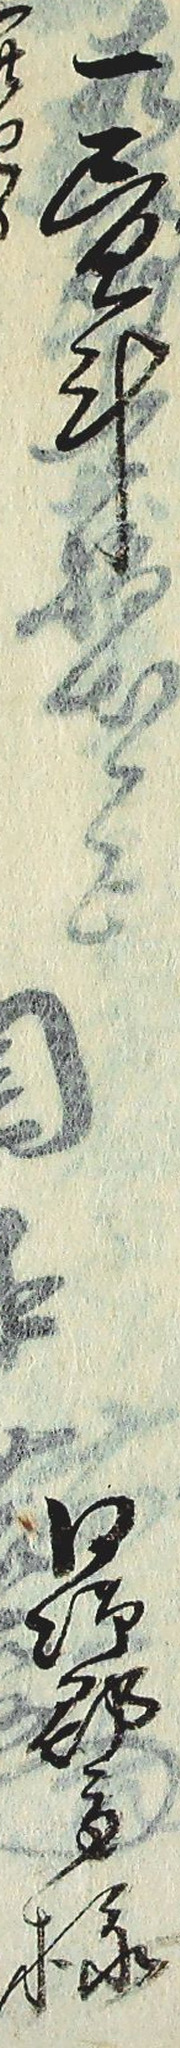一昼夜同御郡方様
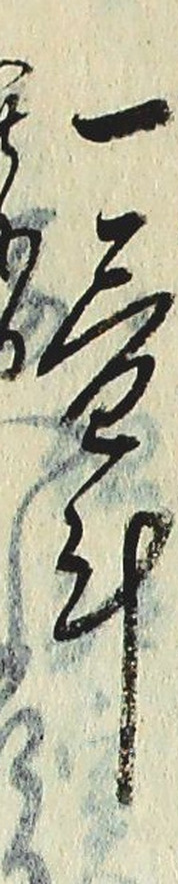一昼夜
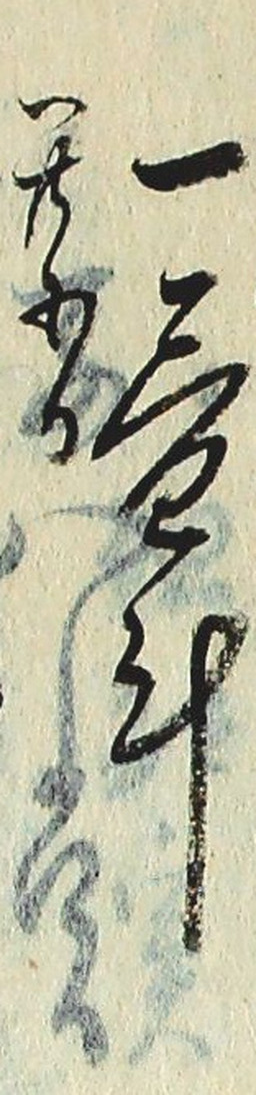同廿五日
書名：名東郡中諸割賦元帳
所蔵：鳴門教育大学 Naruto University of Education
